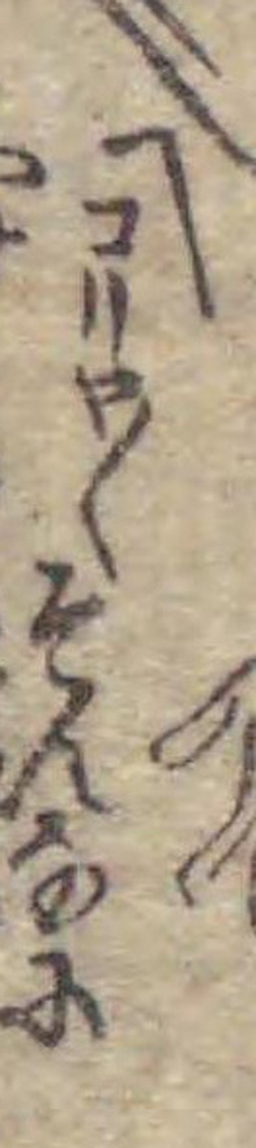〽コリヤ〳〵そんんあに
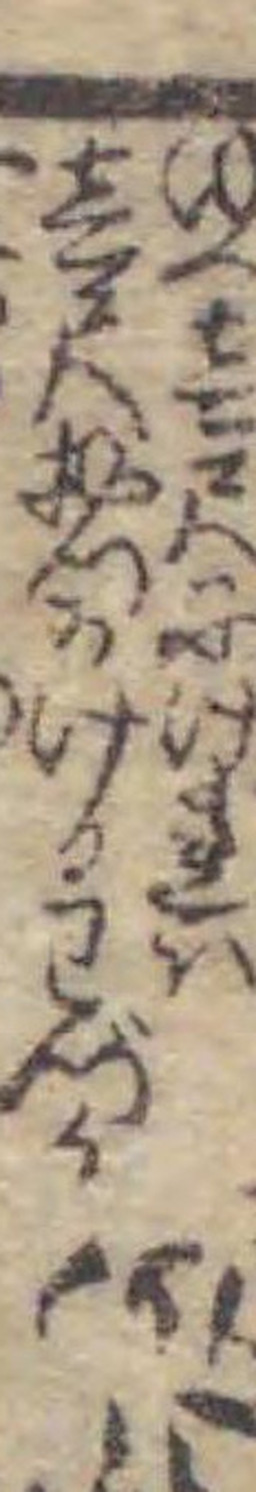壱尺おつかけるわづか
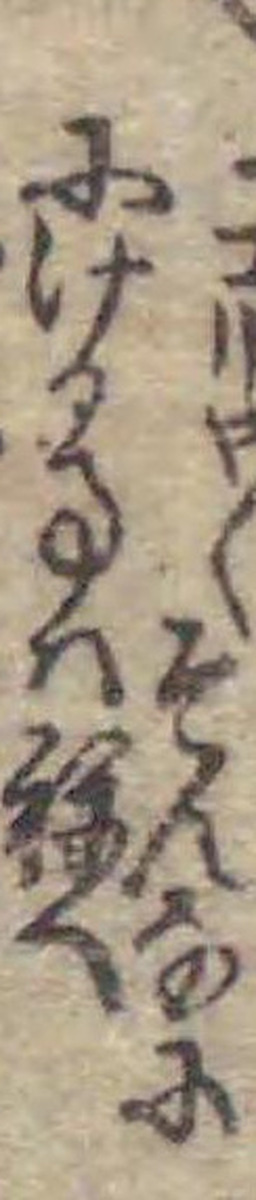にける事はねへ
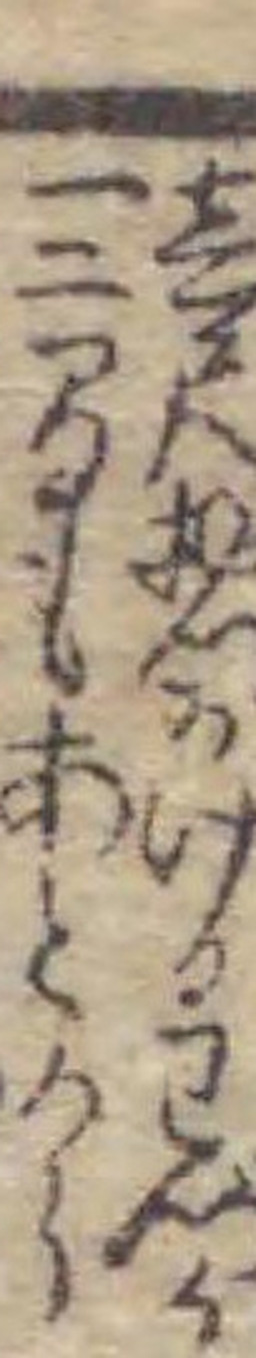一二間もあとから
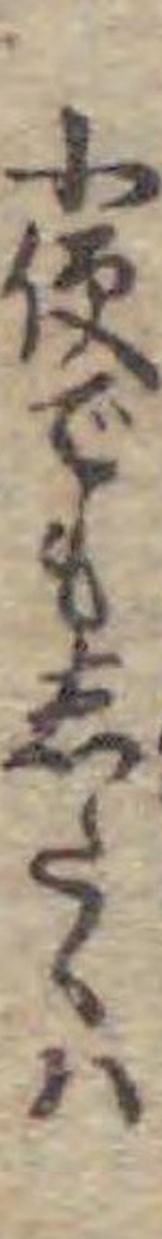小便でもしたくは
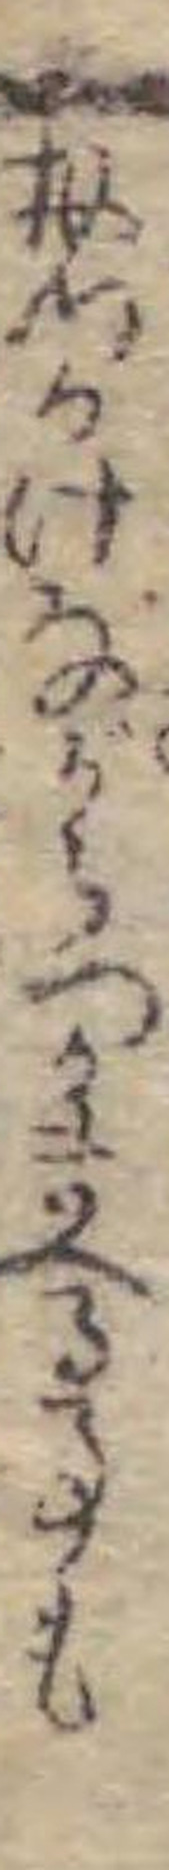おつかけながらつかまへる事も
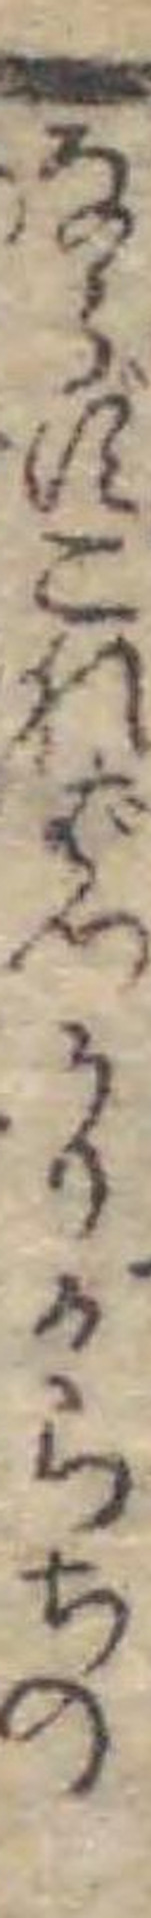ならずこればつかりからちの
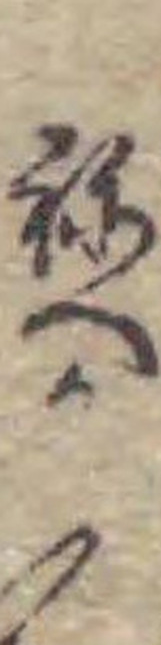ねへか
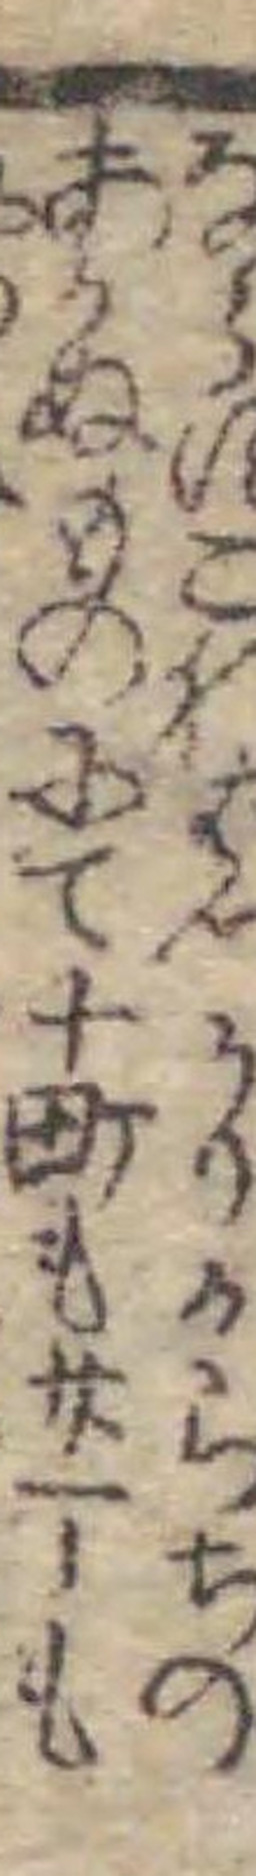あかぬものにて十町も廿丁も
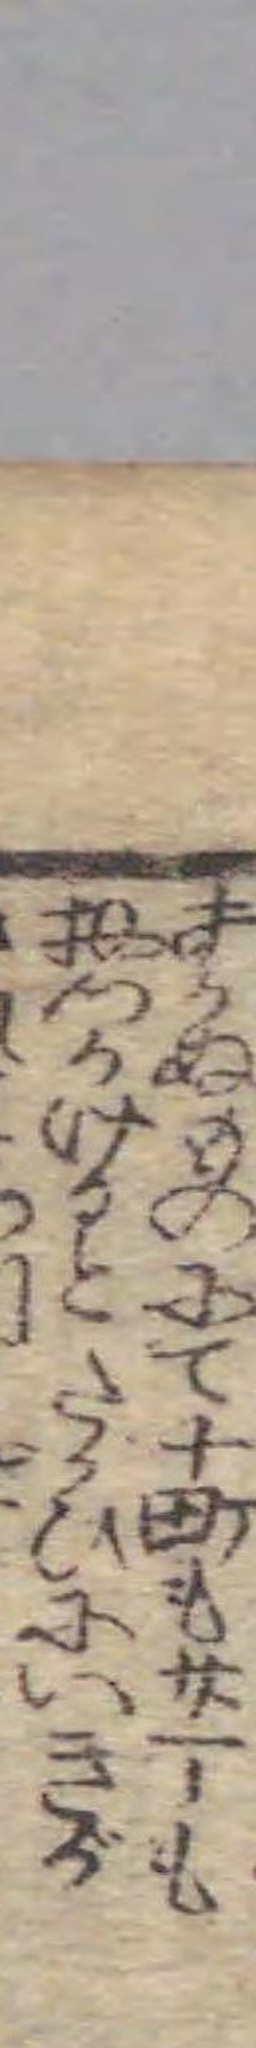おつかけるとたかひにいきが
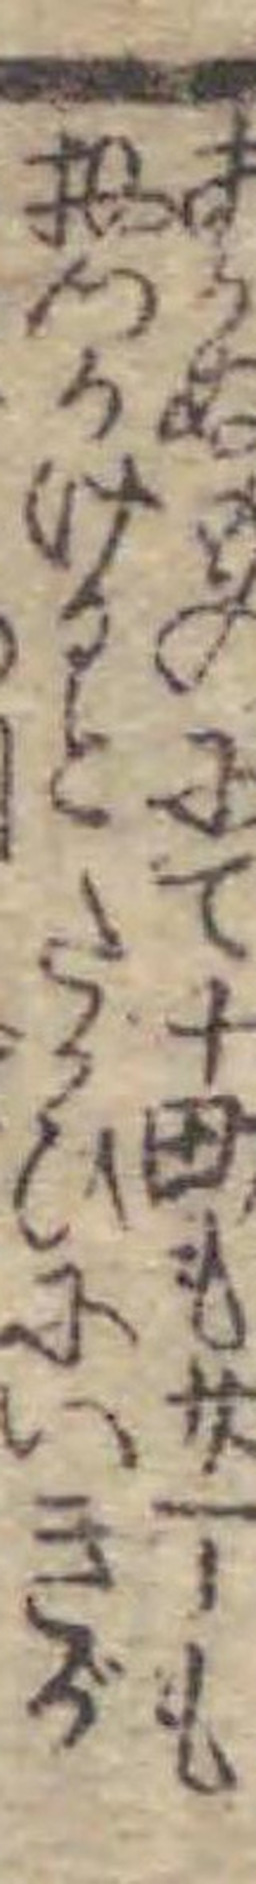おつかけるとたかひにいきが
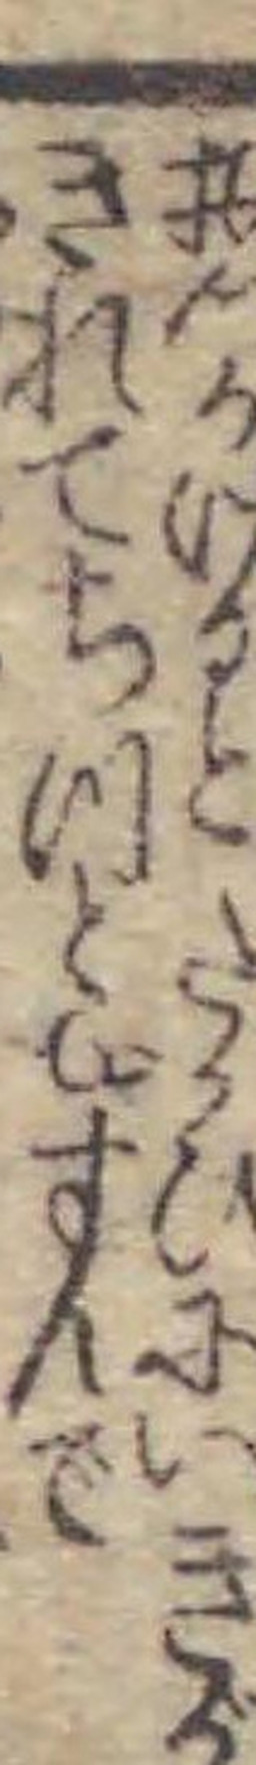きれてちつとやすんで
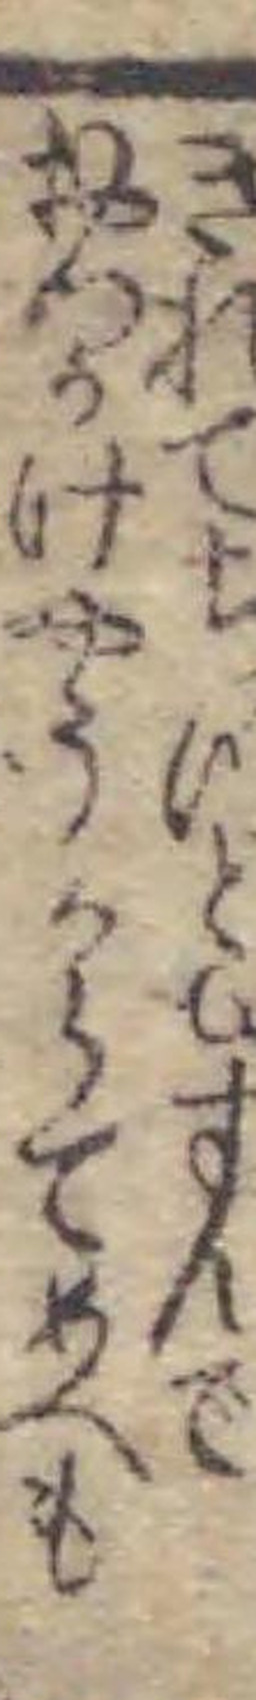おつかけやうからてめへも
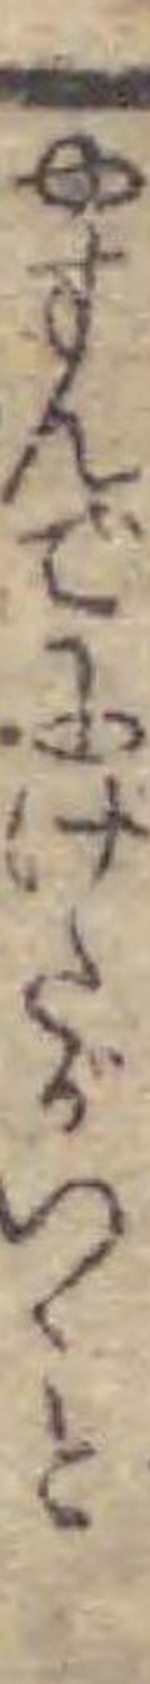やすんでにげたがいゝと
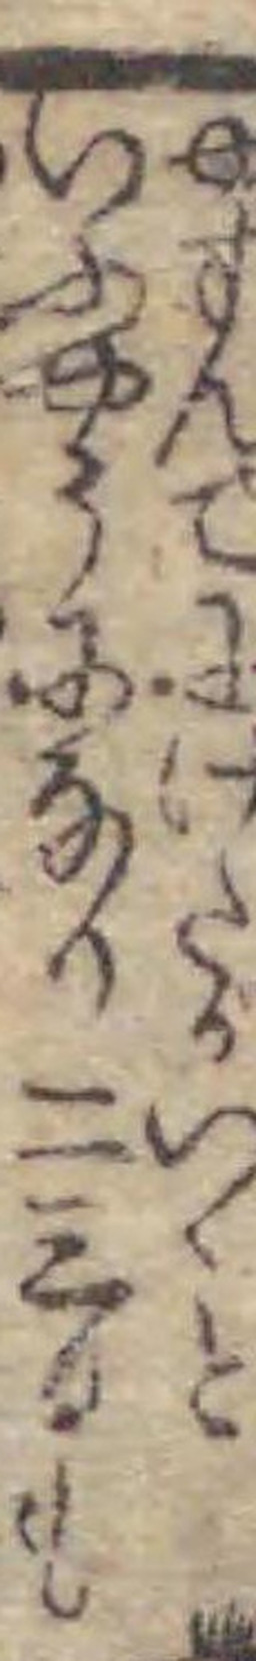いふやうになり二三日も
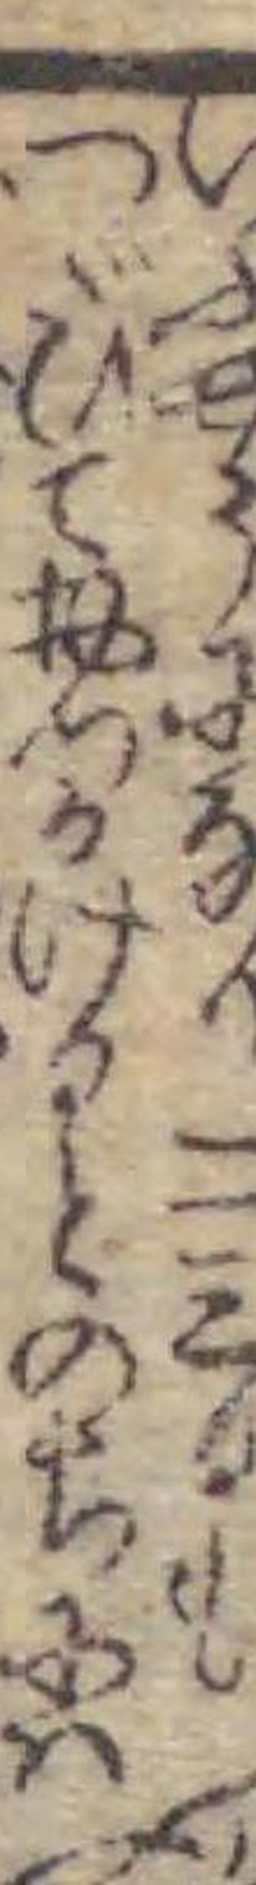つゞひておつかけるとのちには
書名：奇妙頂礼胎錫杖 : 3巻
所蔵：国立国会図書館 National Diet Library, JAPAN
